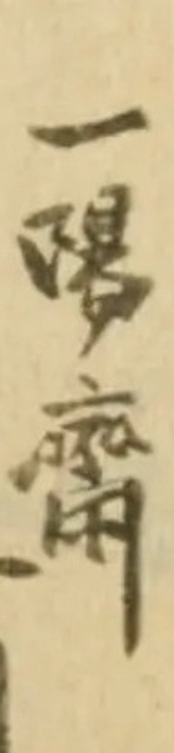一陽斎
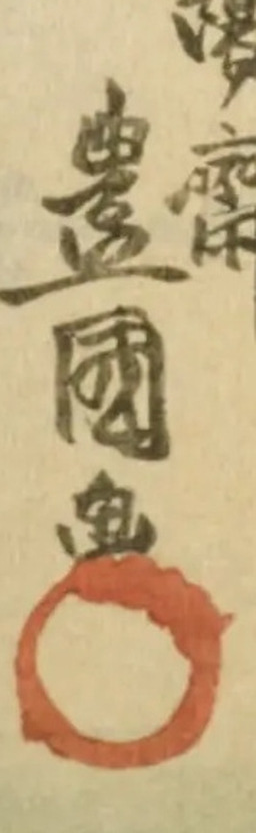豊国画
